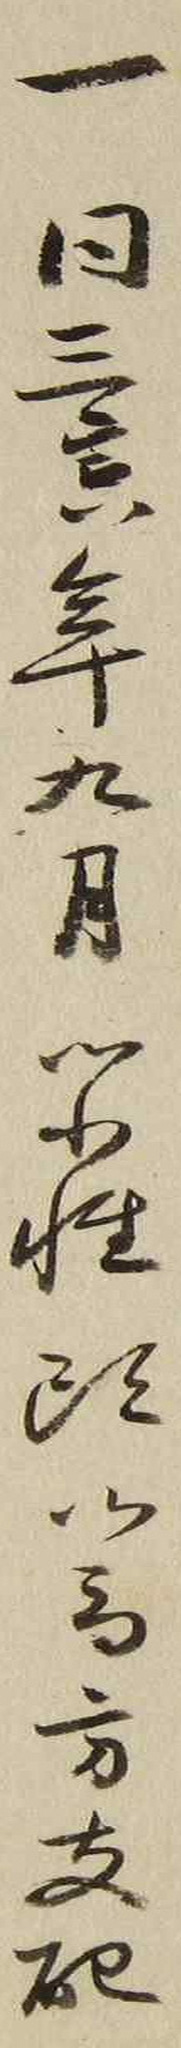一同三寅年九月御小姓頭御馬方支配
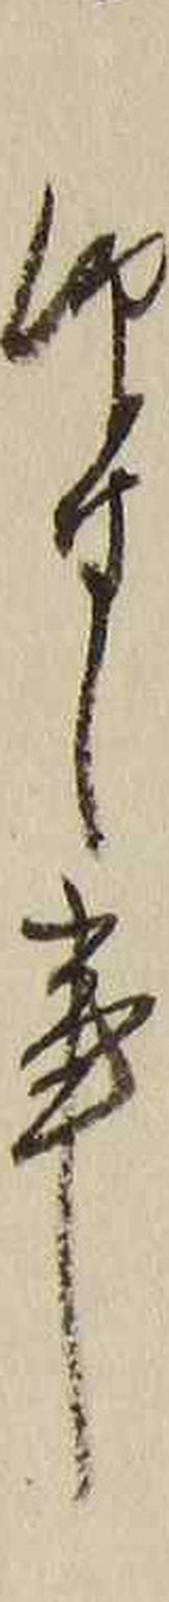被仰付候事
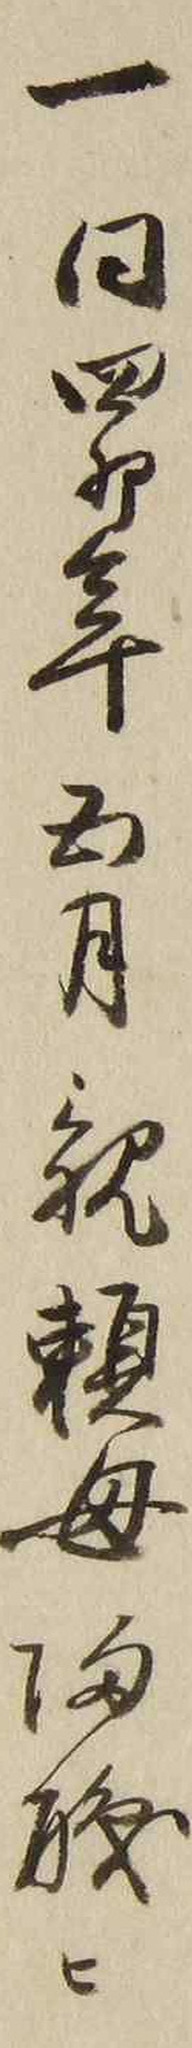一同四卯年五月親賴母帰職被

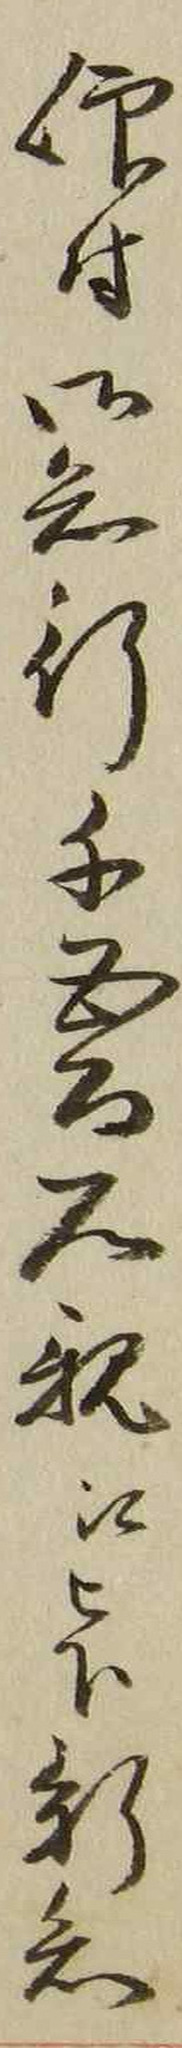被仰付御知行千五百石親江被下新知
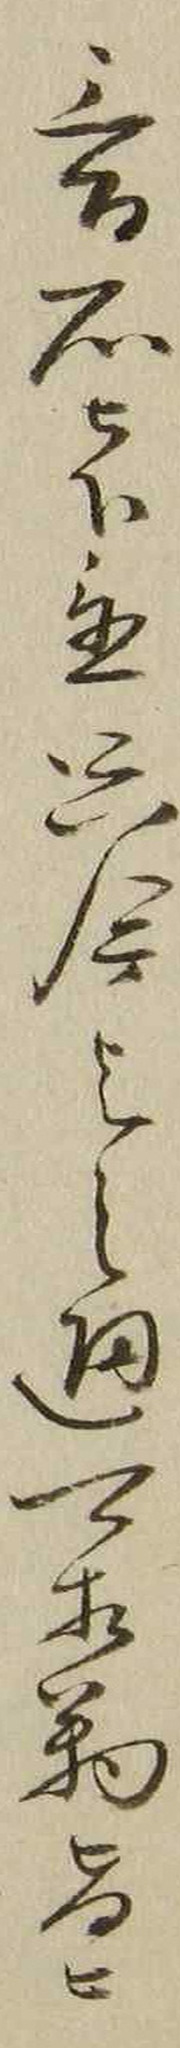三百石被下置只今迄之通可相勤旨被
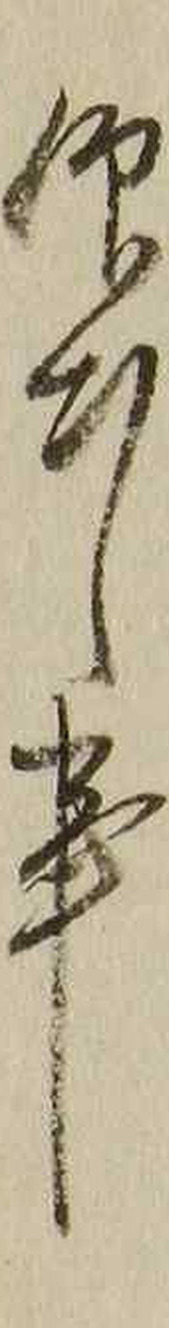仰出候事
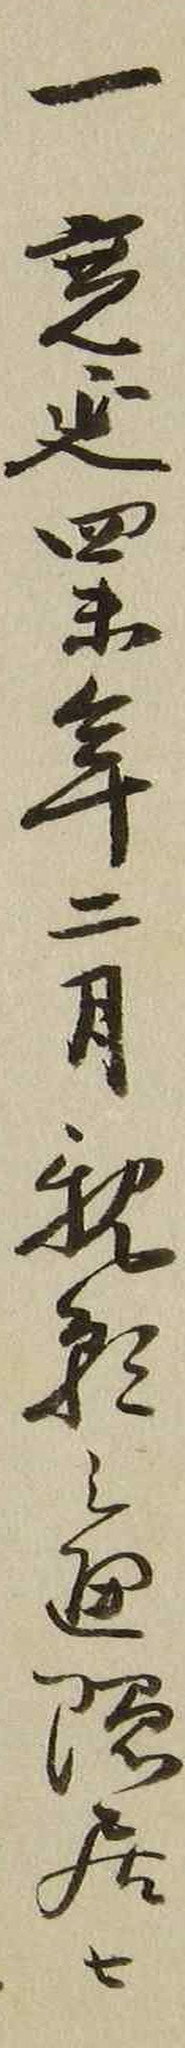一寛延四未年二月親願之通隠居被
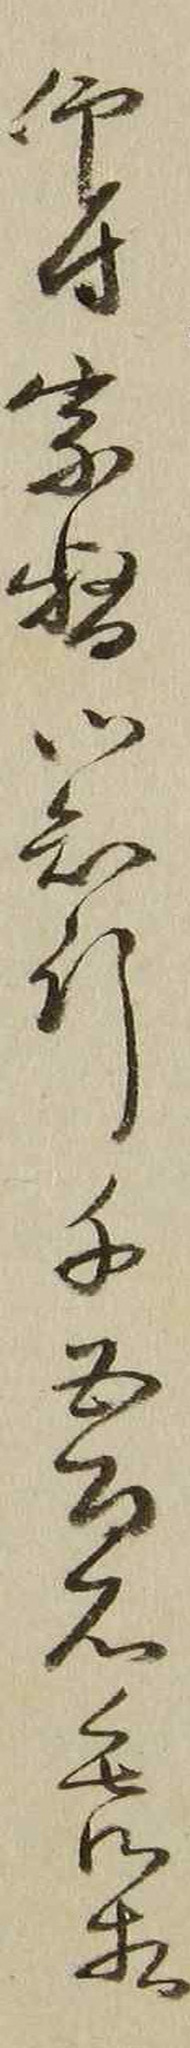仰付家督御知行千五百石無御相
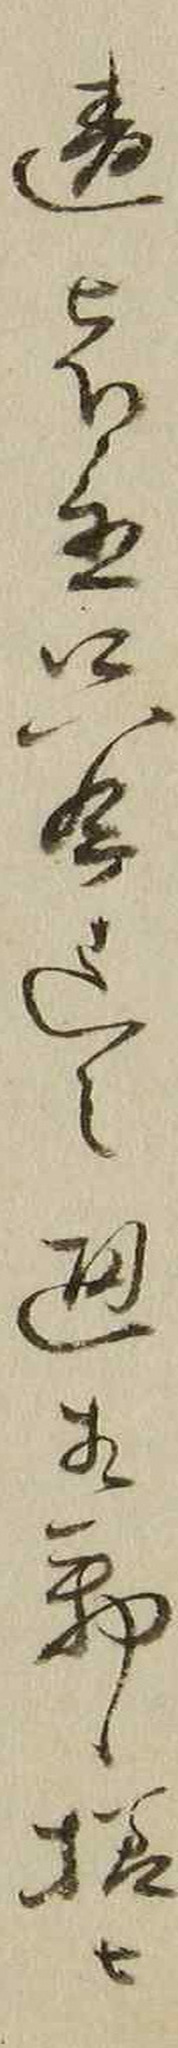違被下置只今迄之通相勤候様被
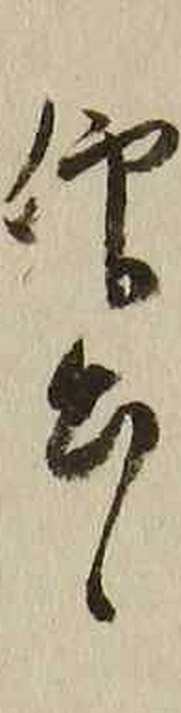仰出候
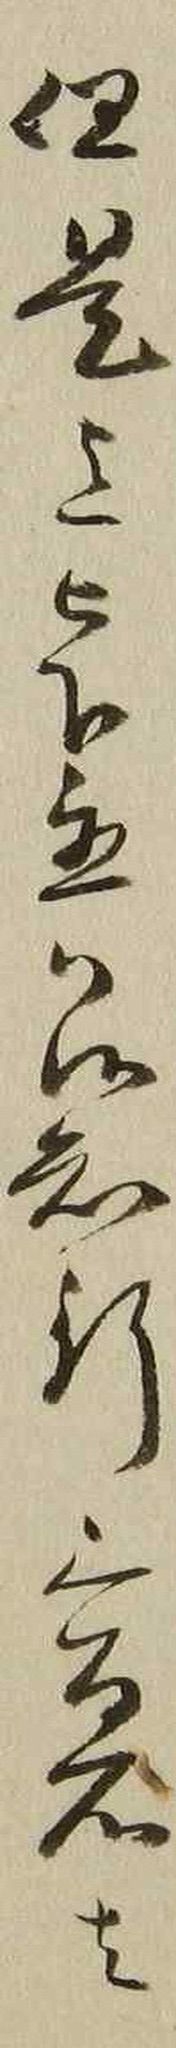但是迄被下置候御知行三百石は
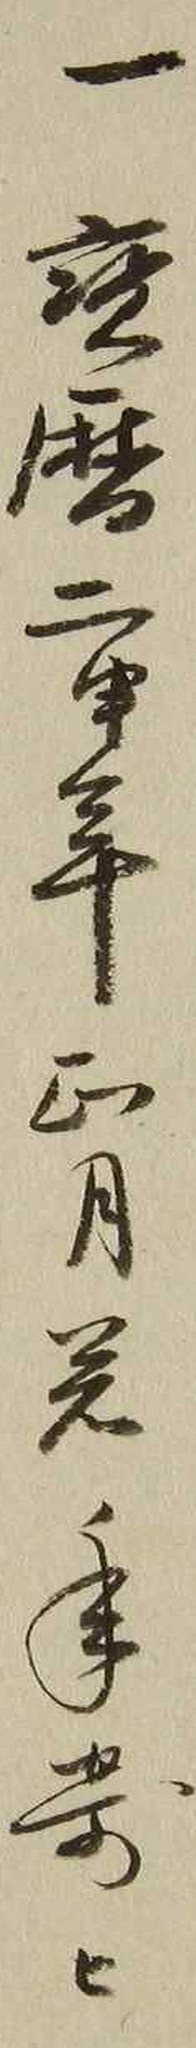一宝暦二申年正月若年寄被
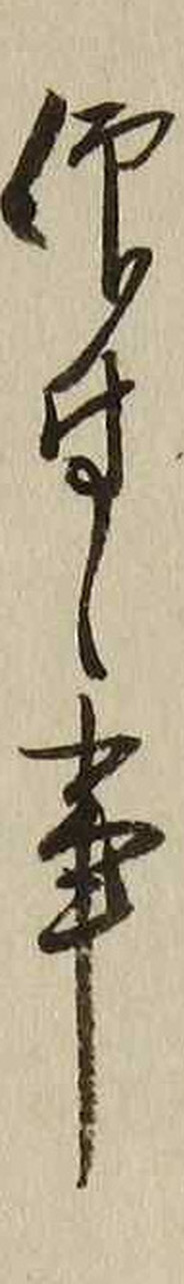仰付候事
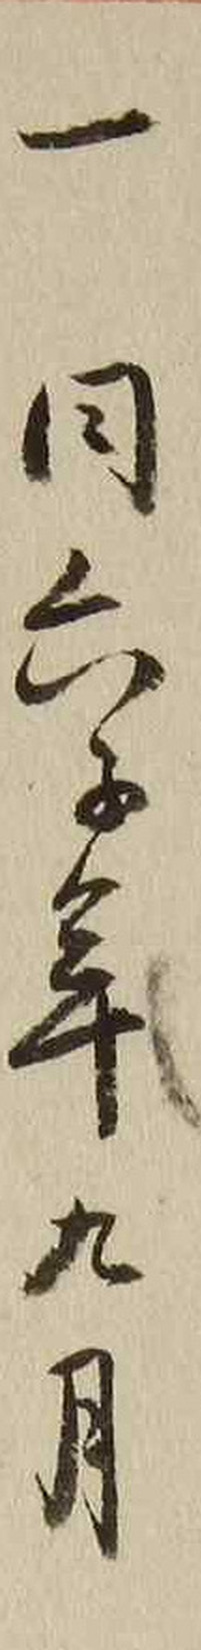一同六子年九月
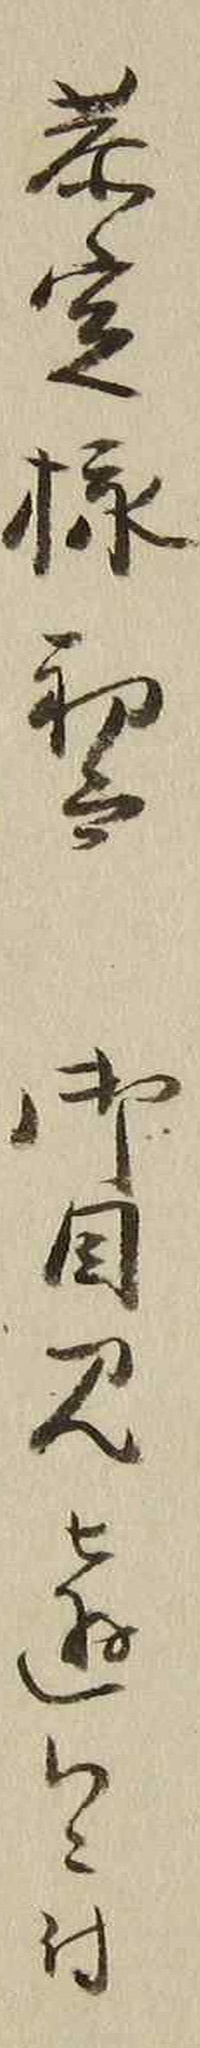恭定様院初而御目見被遊候に付
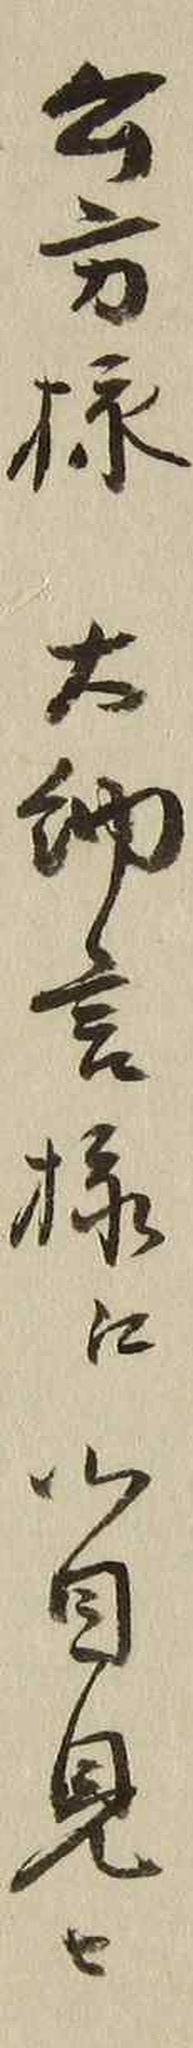公方様大納言様江御目見被
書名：諸士系譜　巻之269　さ之部1
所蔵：会津若松市立会津図書館
